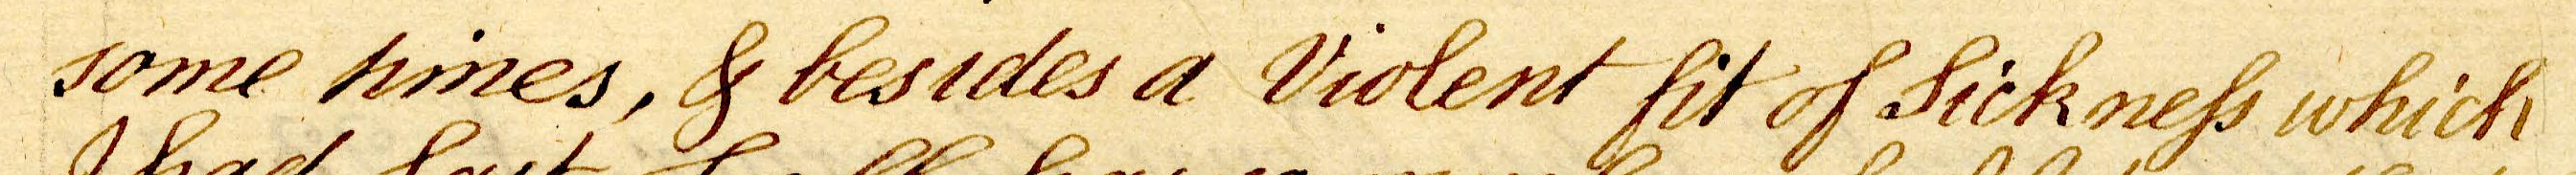some times, & besides a Violent fit of Sickness which
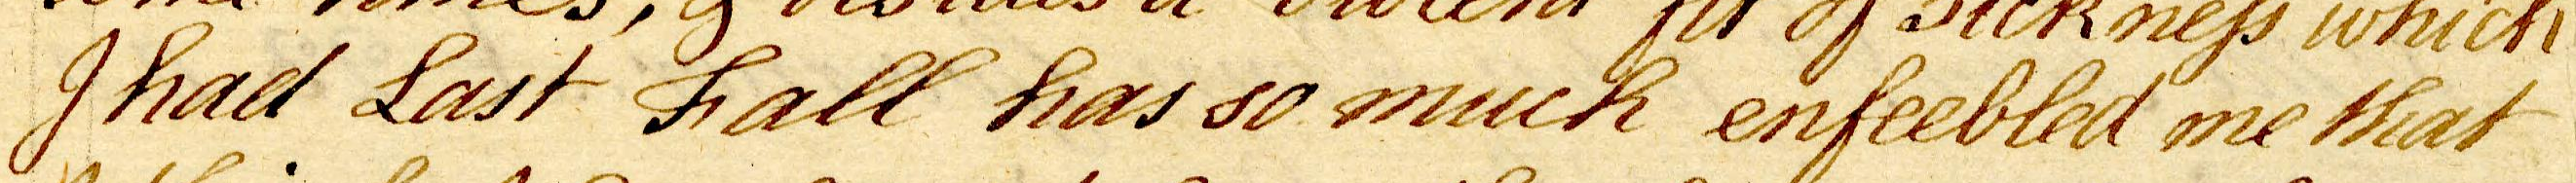I had Last Fall has so much enfeebled me that
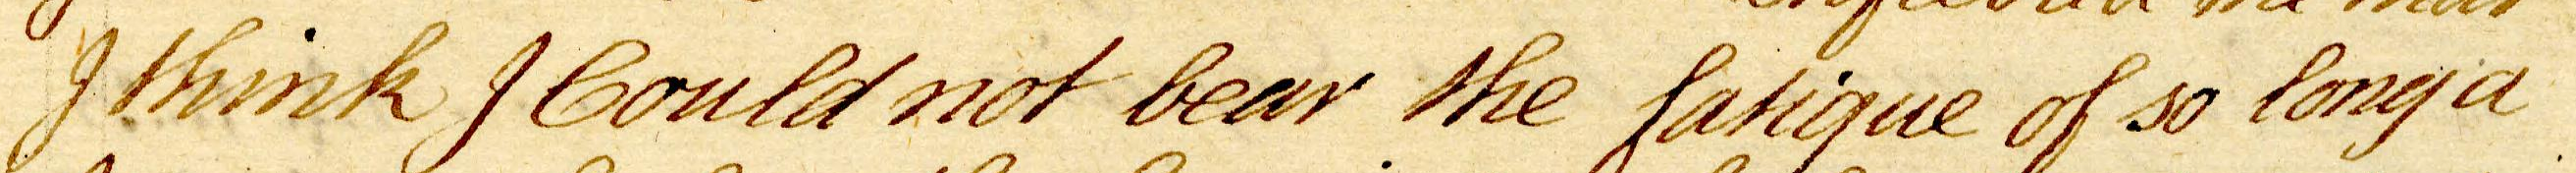I think I Could not bear the fatigue of so long a
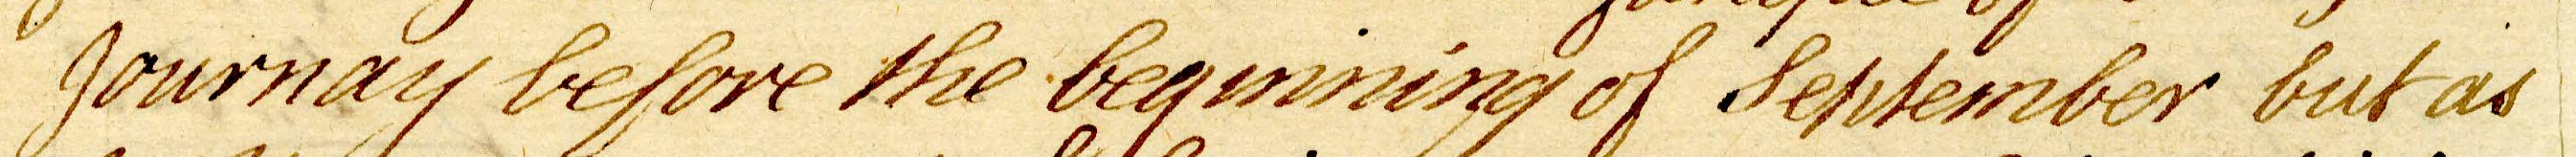Journay before the beginning of September but as
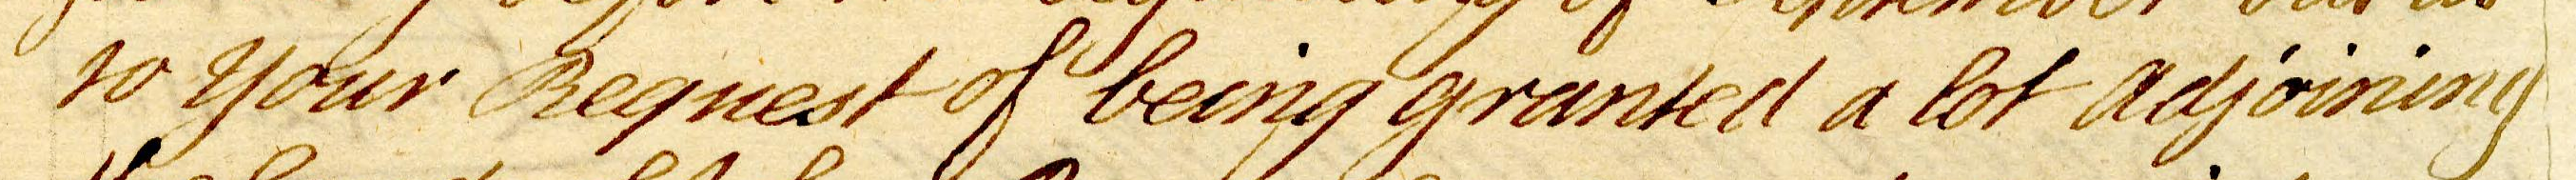to Your Request of being granted a lot Adjoining
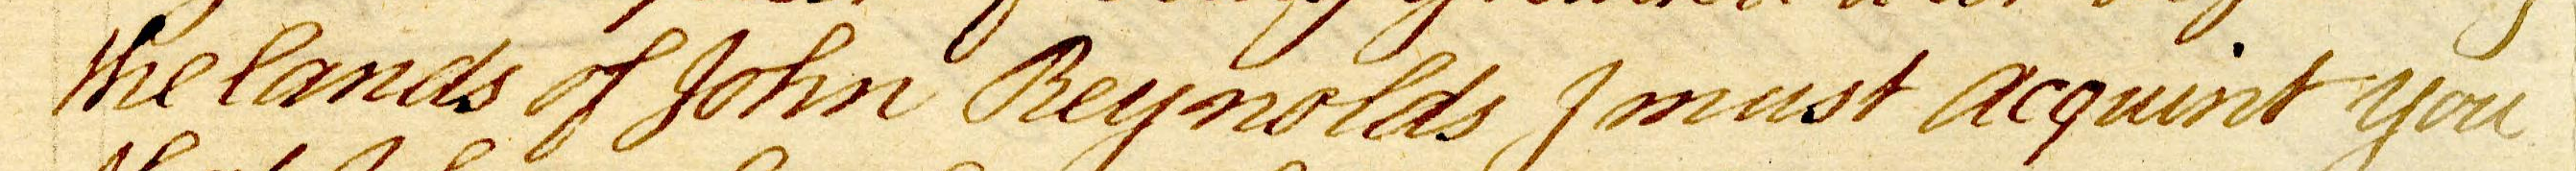the lands of John Reynolds I must Acquint You
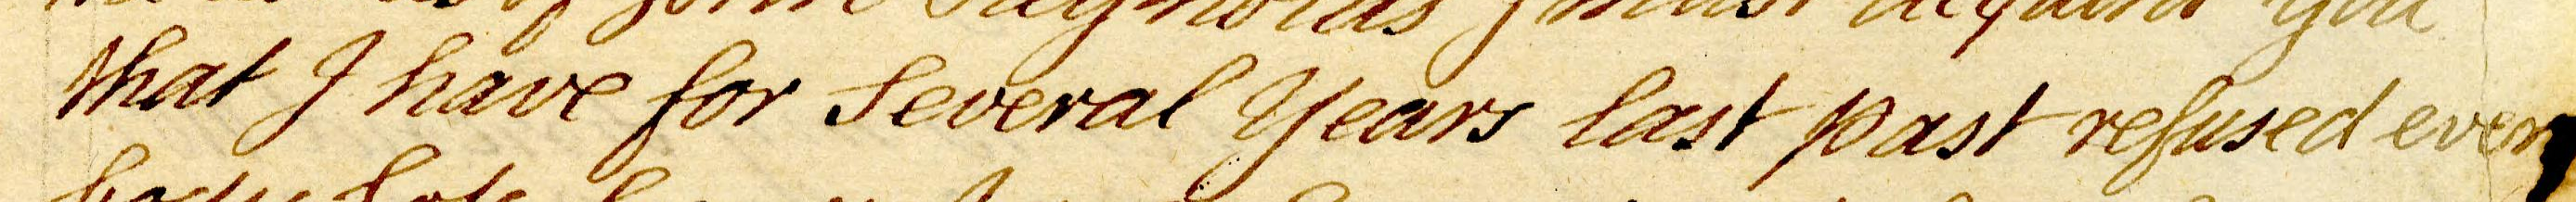that I have for Several Years last past refused every
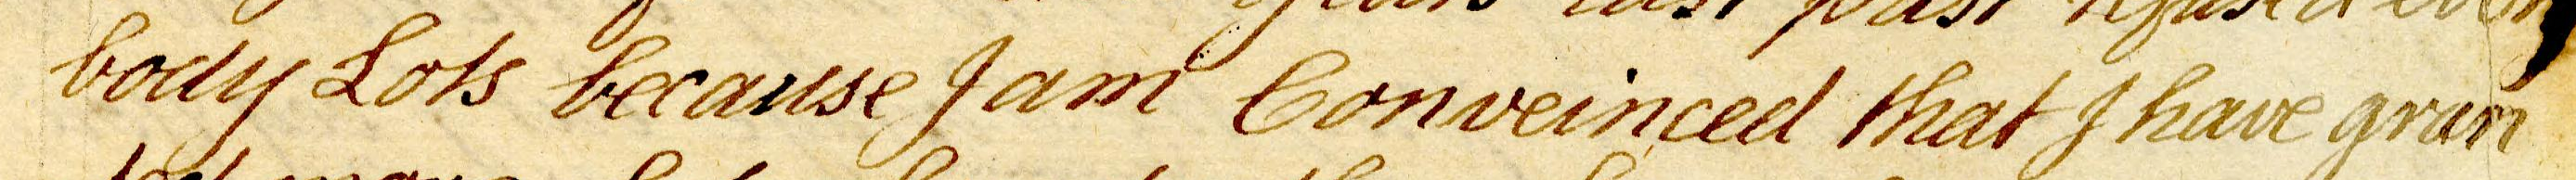body Lots because I am Conveinced that I have gran
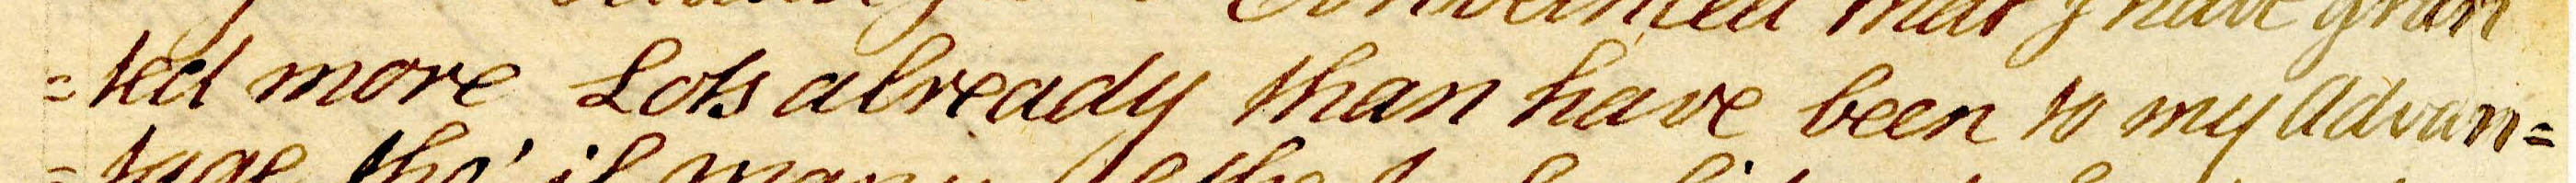-ted more Lots already than have been to my Advan-
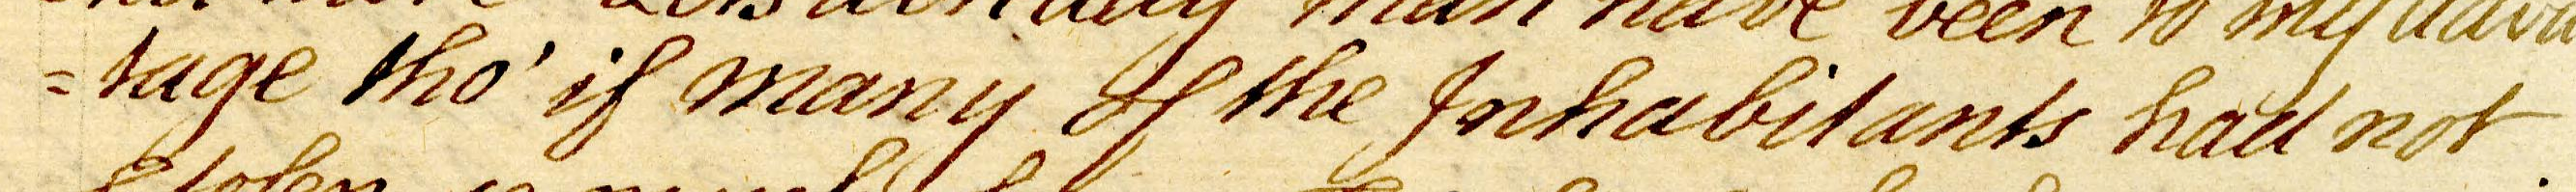-tage tho' if many of the Inhabitants had not
